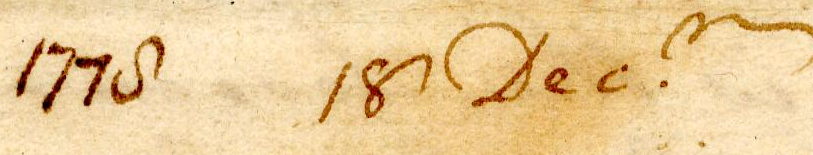1778 18 Dec^r.
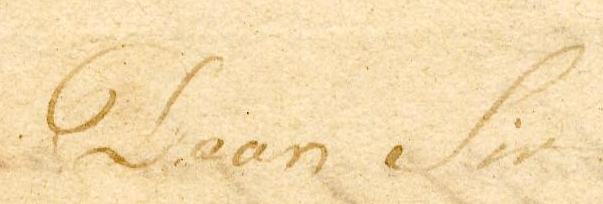Dear Sir
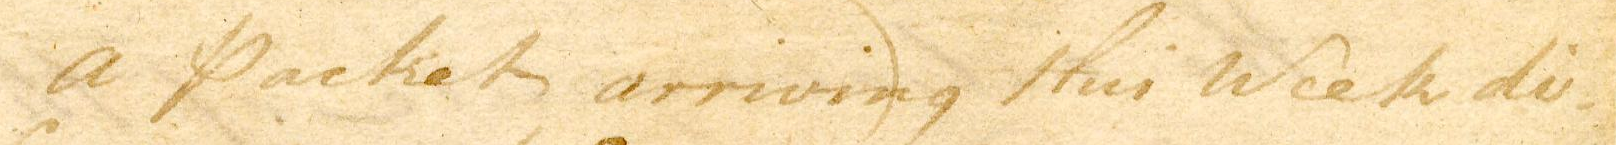A packet arriving this Week dis-
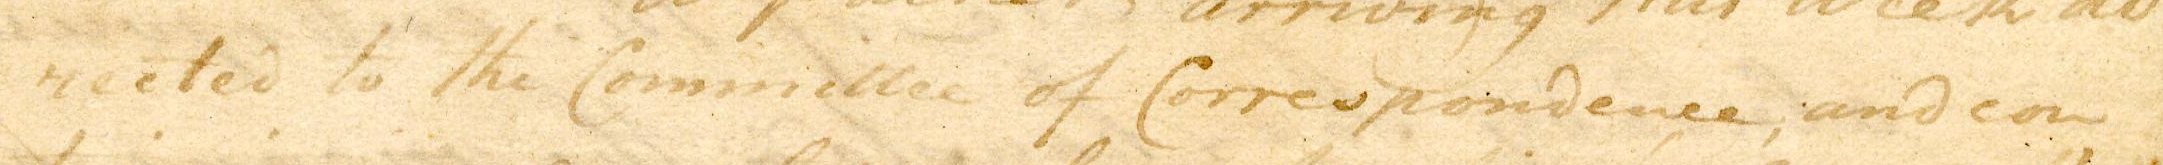rected to the Committee of Correspondence, and con-
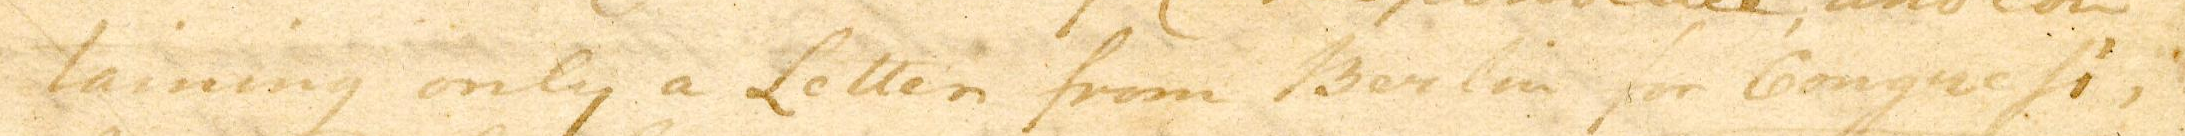taining only a Letter from Berlin for Congress,
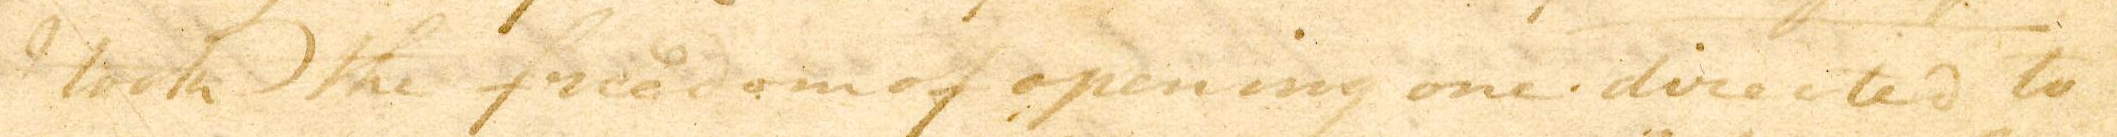took the freedom of opening one directed to
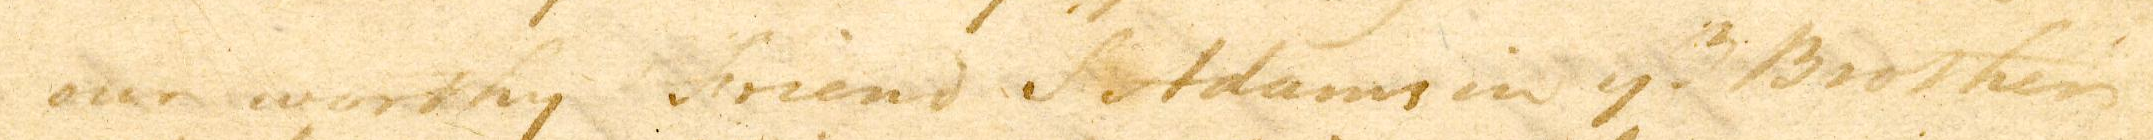our word by Friend S Adams in y^r. Brother
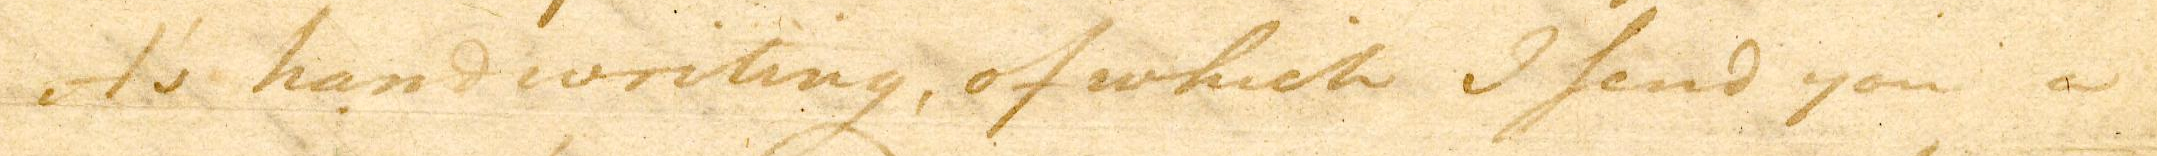it's hand writing, of which I send you a
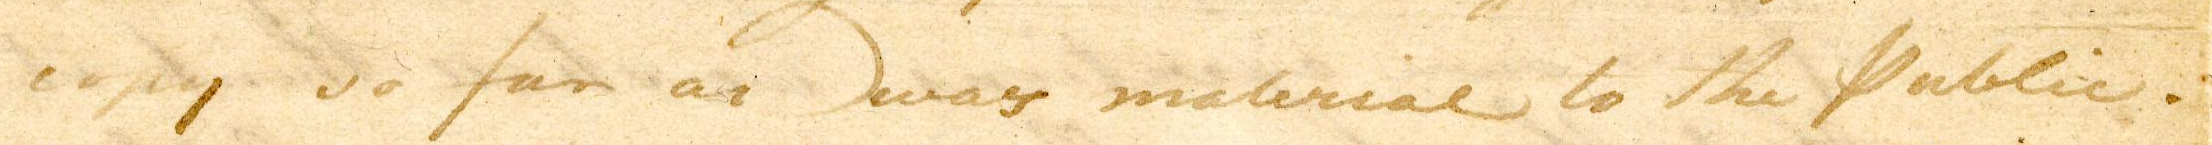copy so far as was material to the Public.
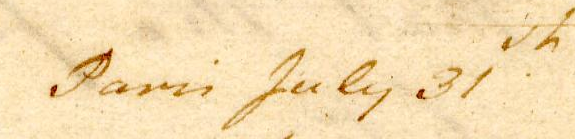Paris July 31^st.
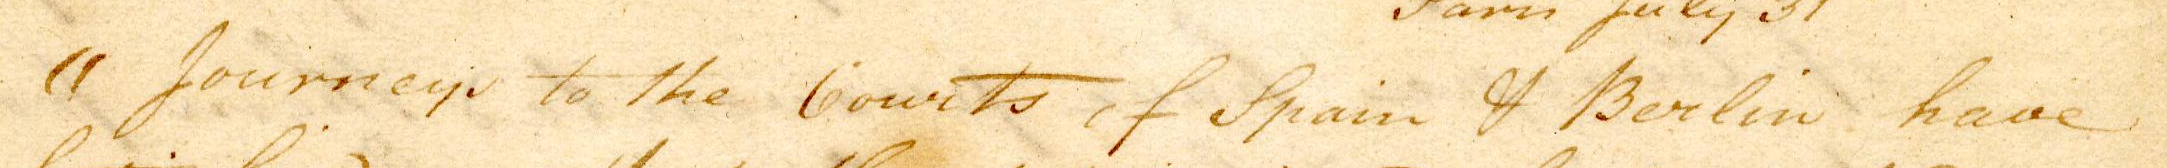A Journey to the Courts of Spain & Berlin have
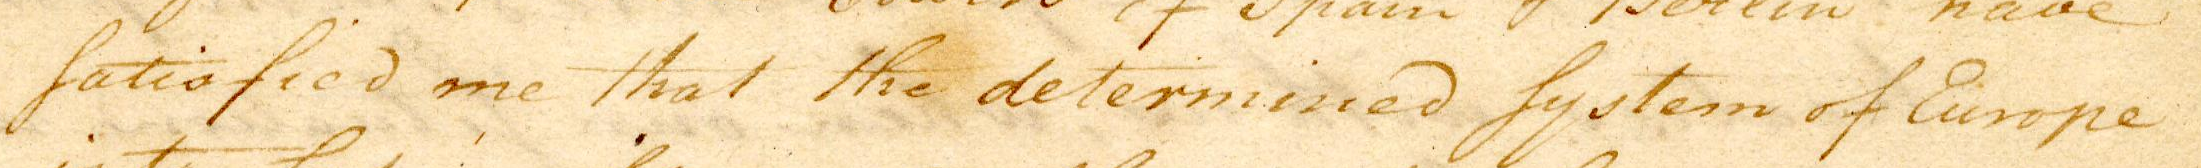Satisfied me that the determined System of Europe
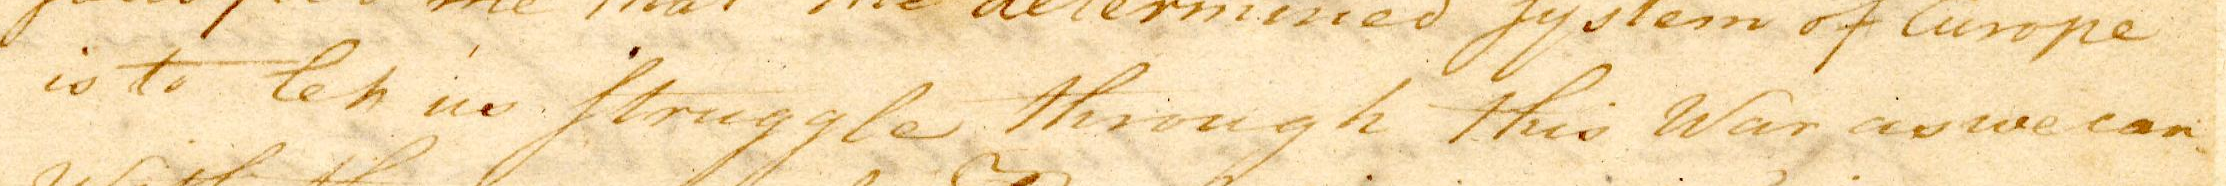is to let us struggle through this War as we can
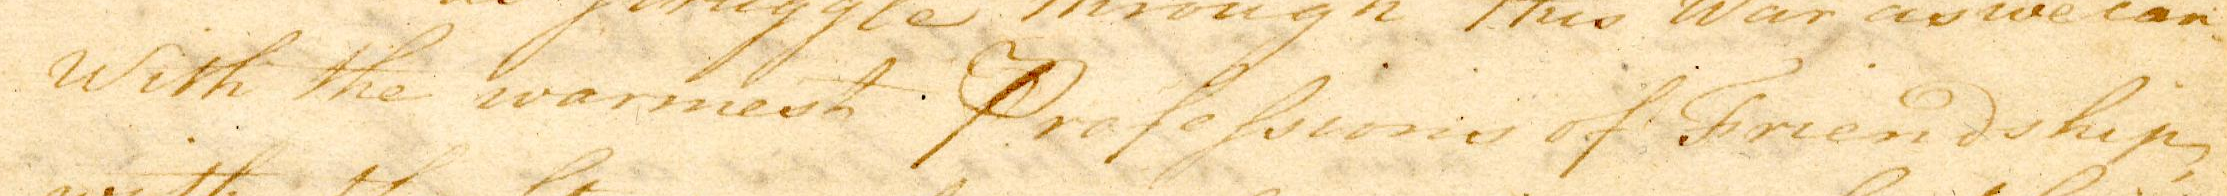with the warmest Professions of Friendship
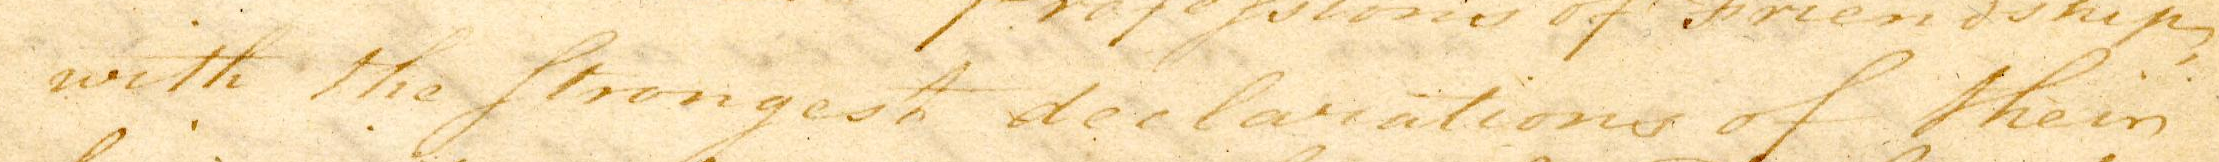with the Strongest declarations of their
